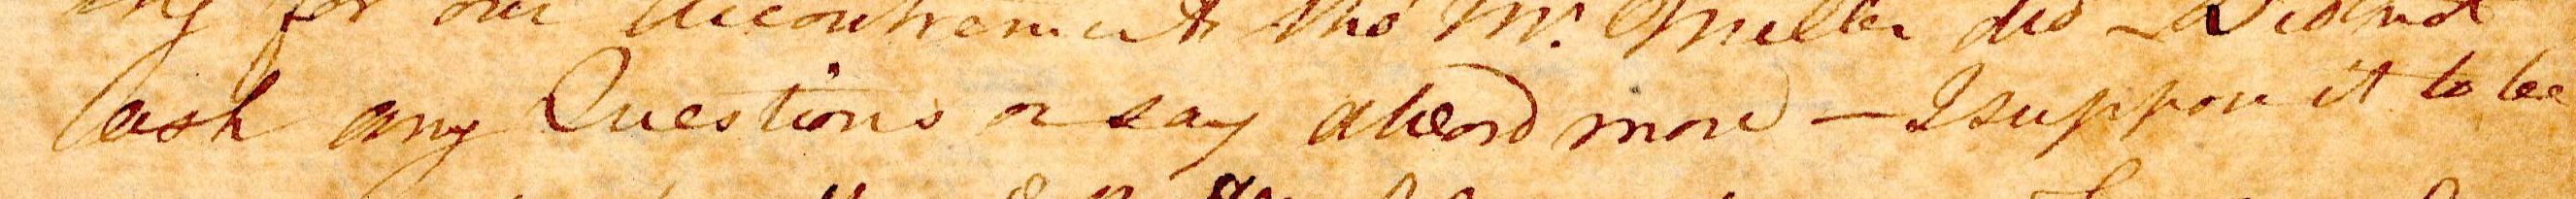ask any Questions or say a word more- I suppose it to be
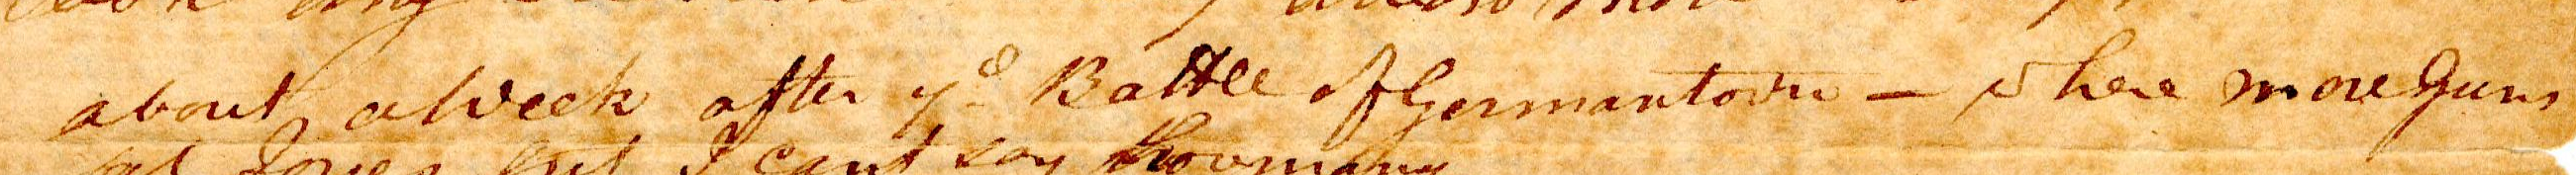about a week after y^e Battle of Germantown - where more guns
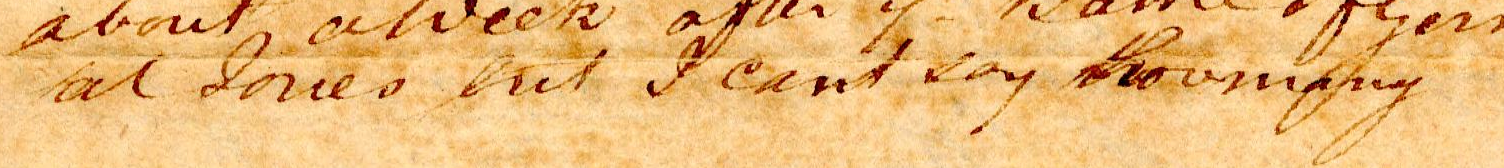at Jones but I can't say how many
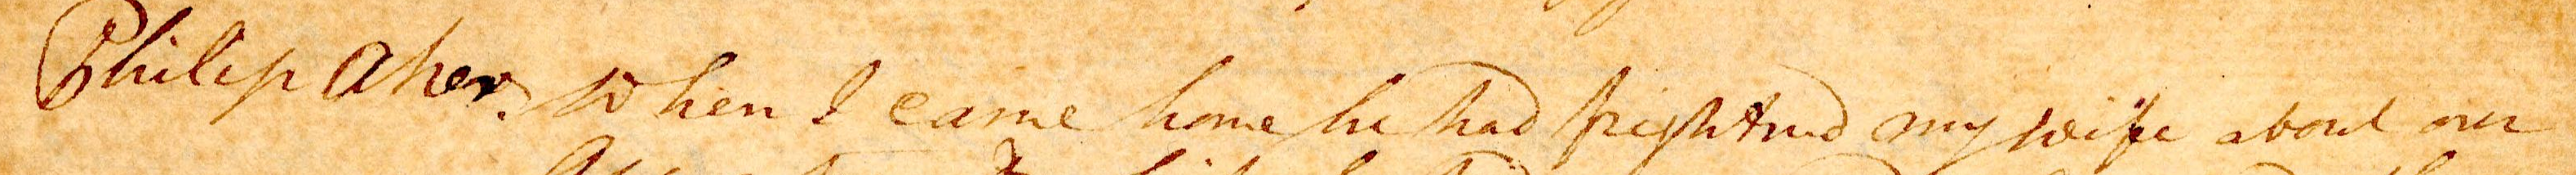Philip Aker. When I came home he had frightened my wife about our
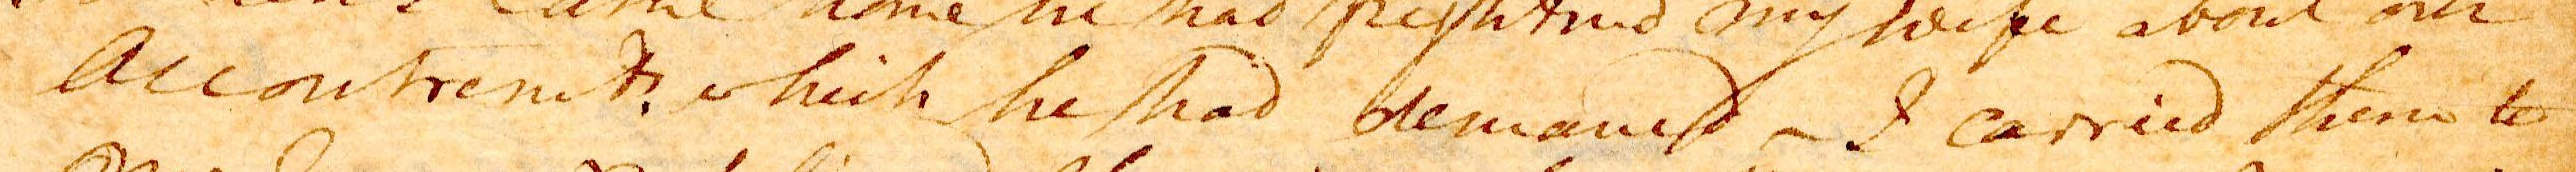Accoutrement which he had demanded- I carried them to
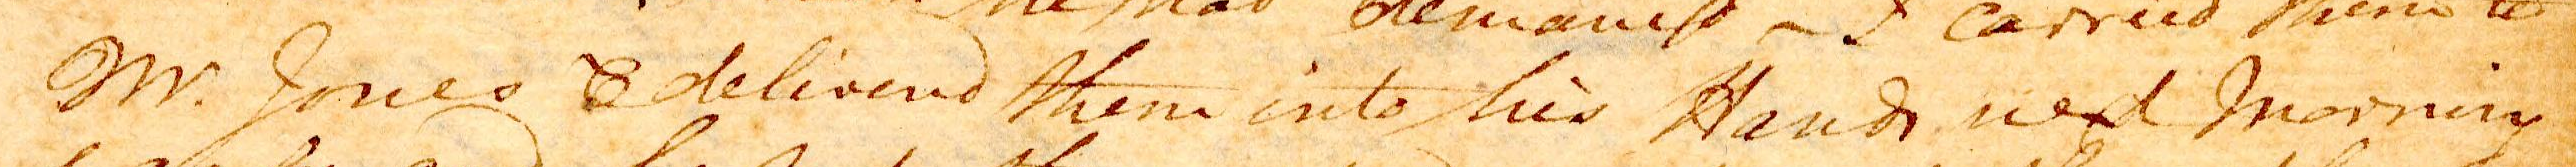M^r. Jones & delivered them into his Hands next Morning
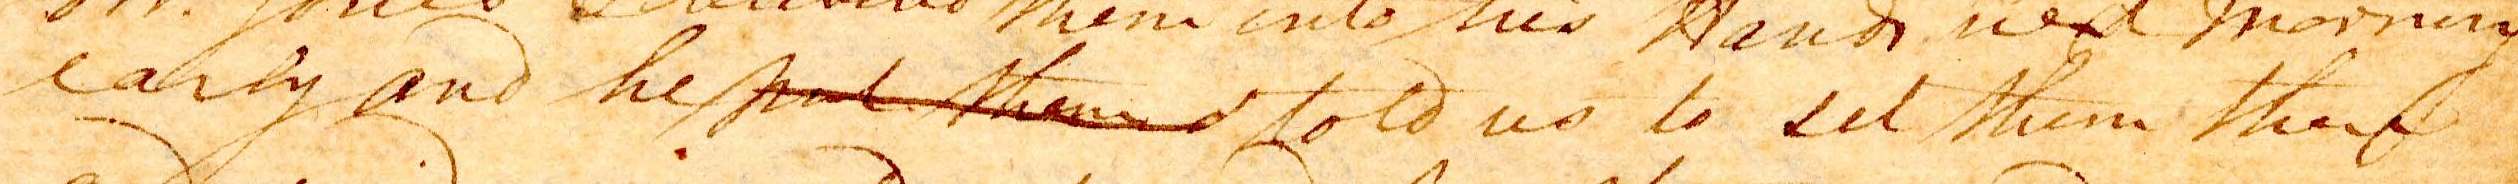early and he [put them] told us to set them there
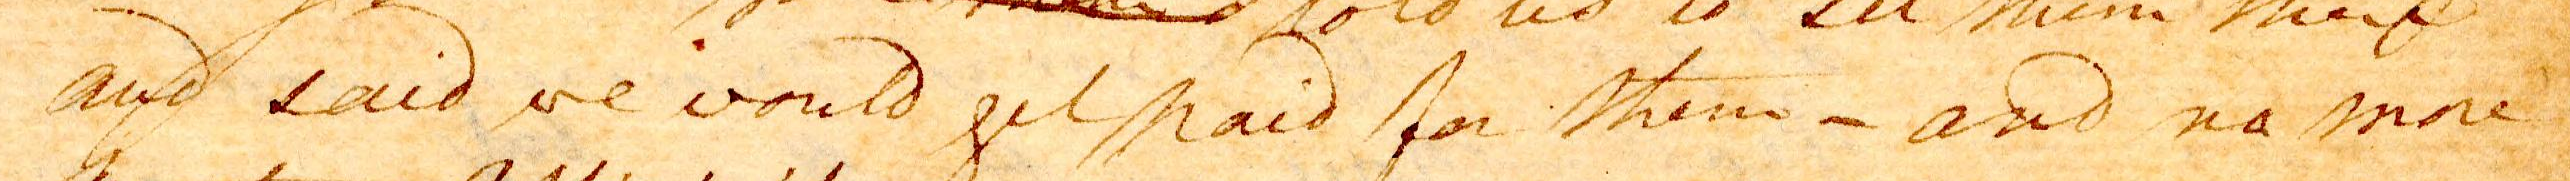and said we would get paid for them- and no more
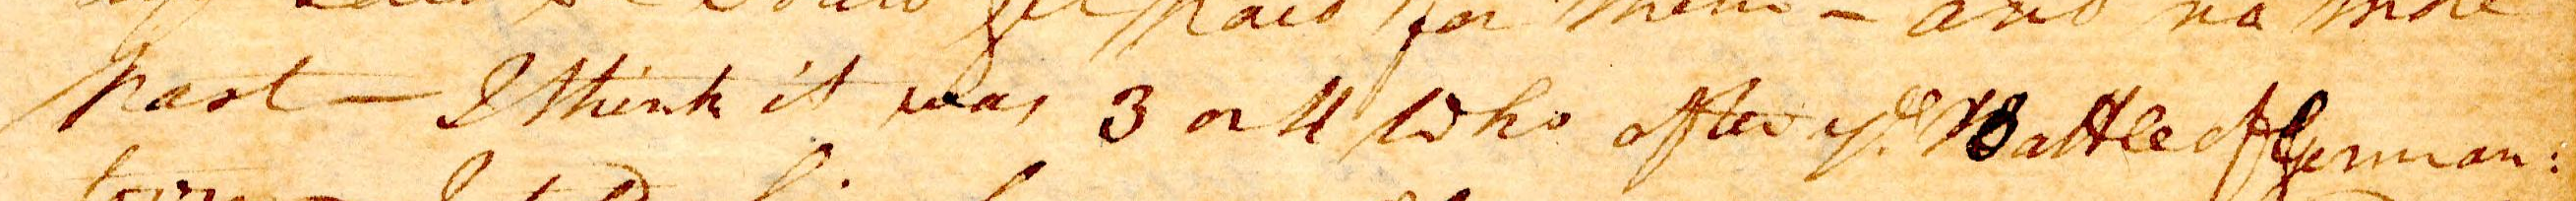past- I think it was 3 or 4 who after y^e Battle of German-
